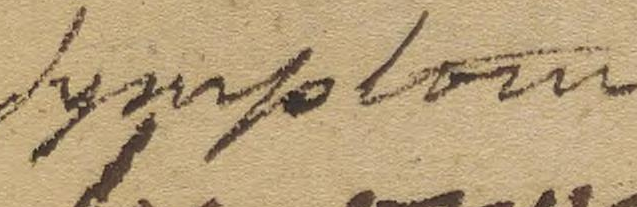symptom
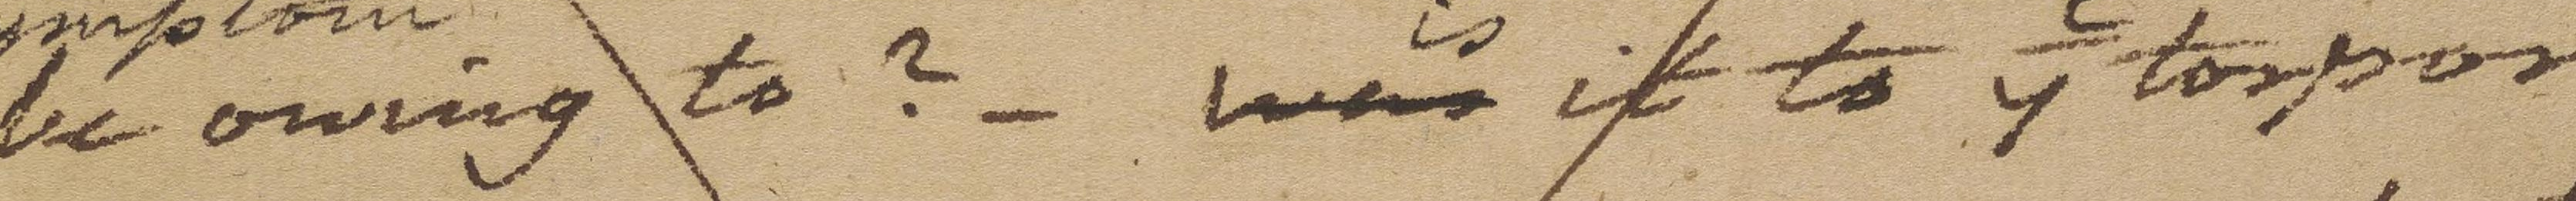be owing to? [was] it to y^e torpor
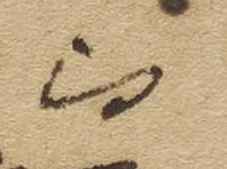is
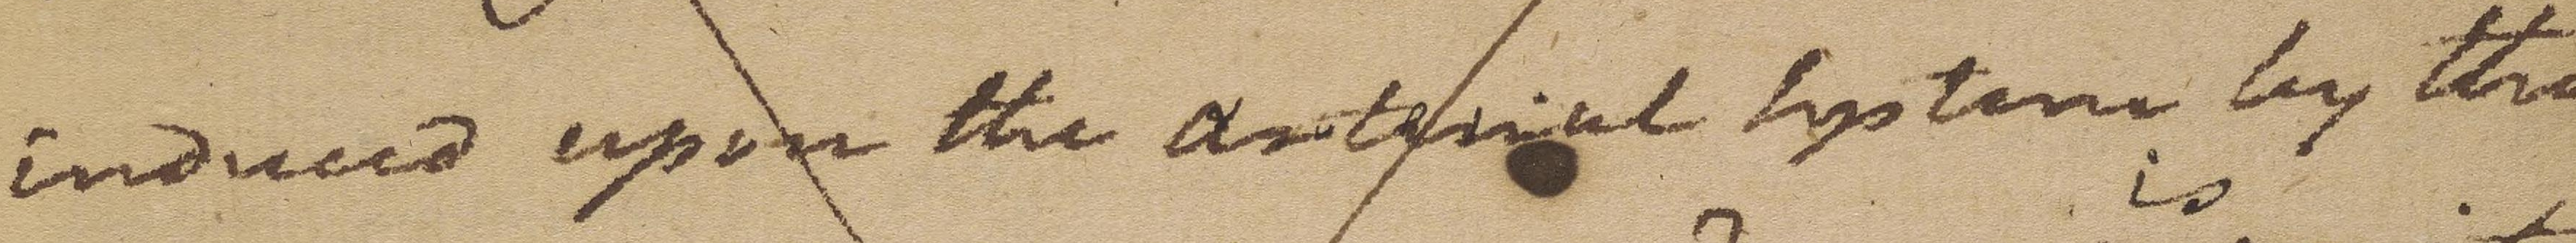induced upon the arterial system by the
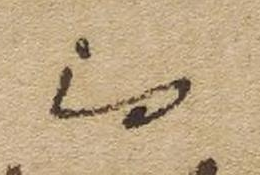is
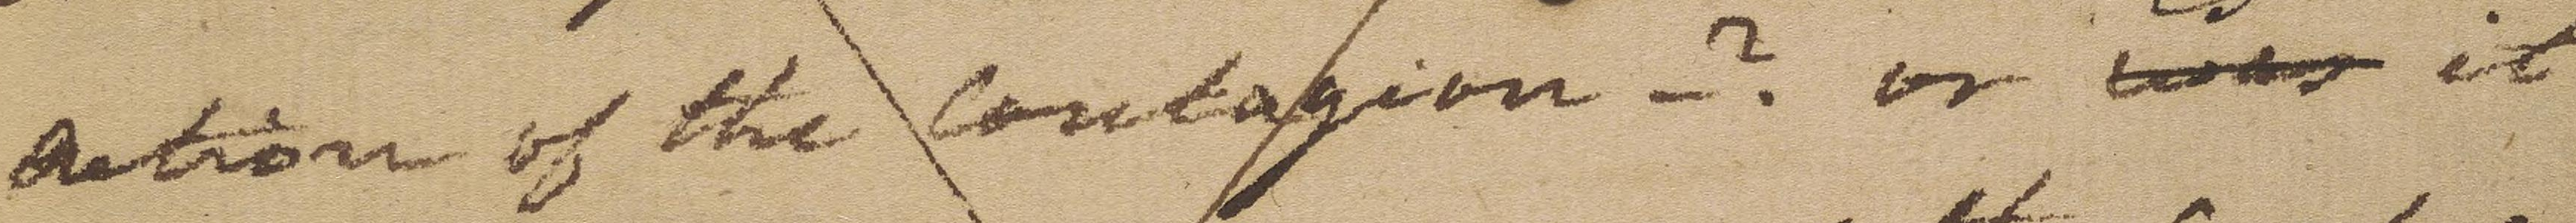action of the contagion? or [was] it
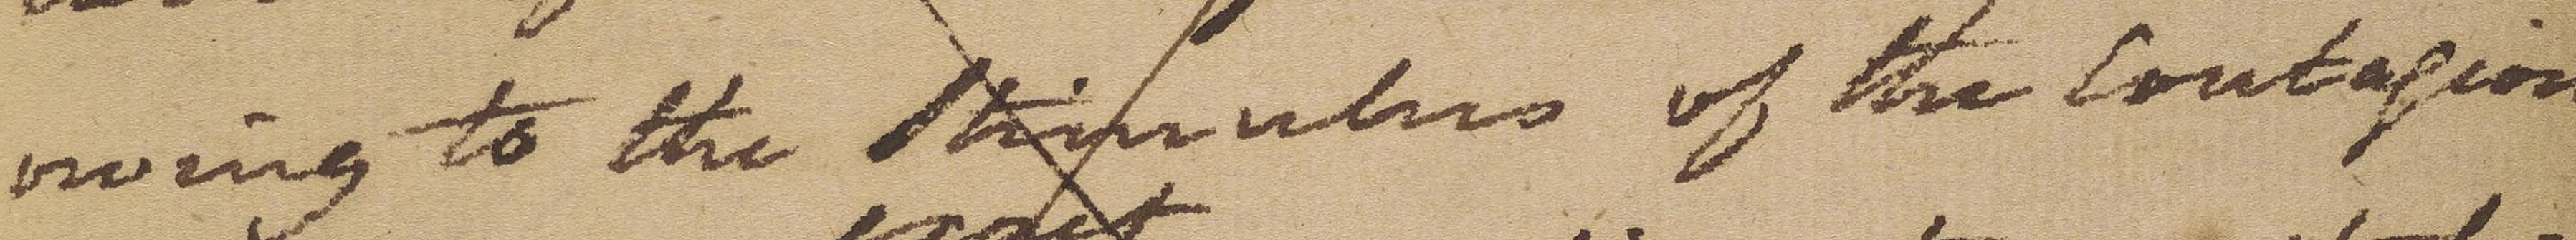owing to the Stimulus of the contagion
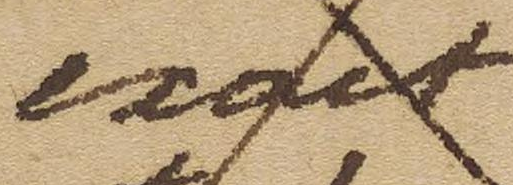exact
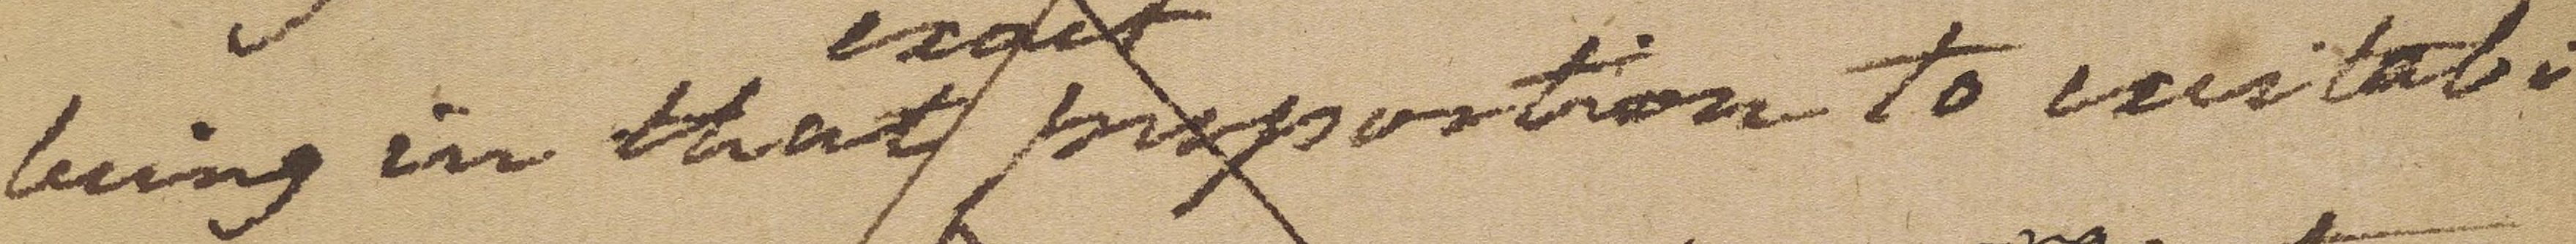being in that ^ proportion to excitabi-
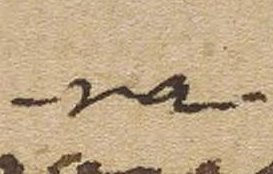-ra
